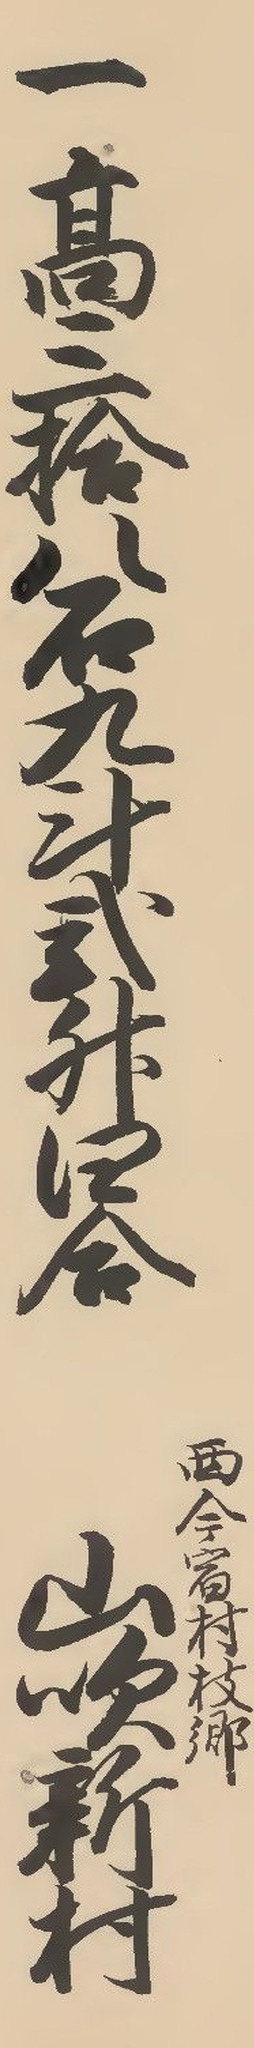一髙三拾八石九斗弐升四合山吹新村
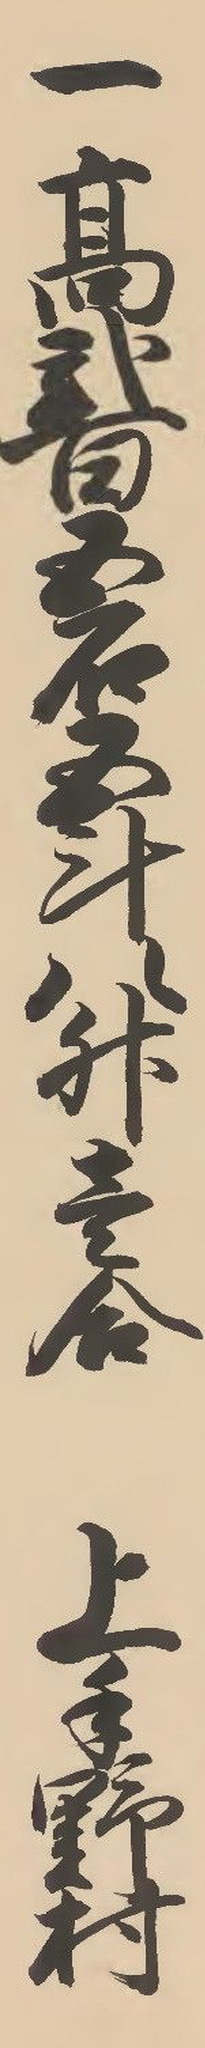一髙弐百五石五斗八升壱合上手野村
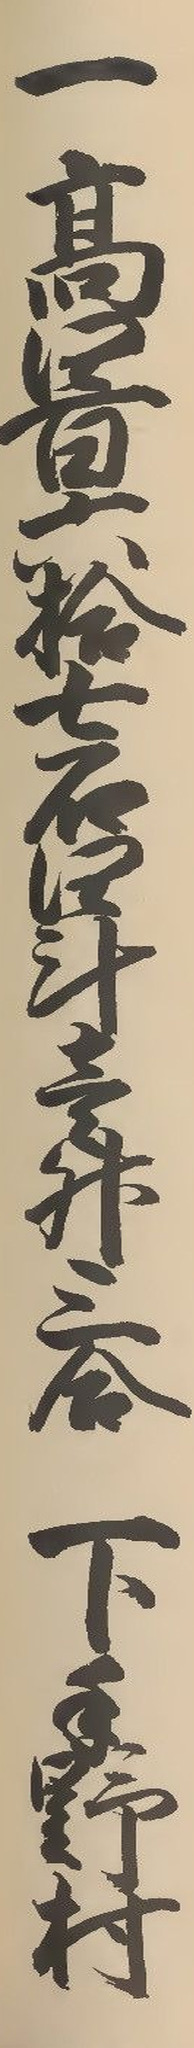一髙四百六拾七石四斗壱升三合下手野村
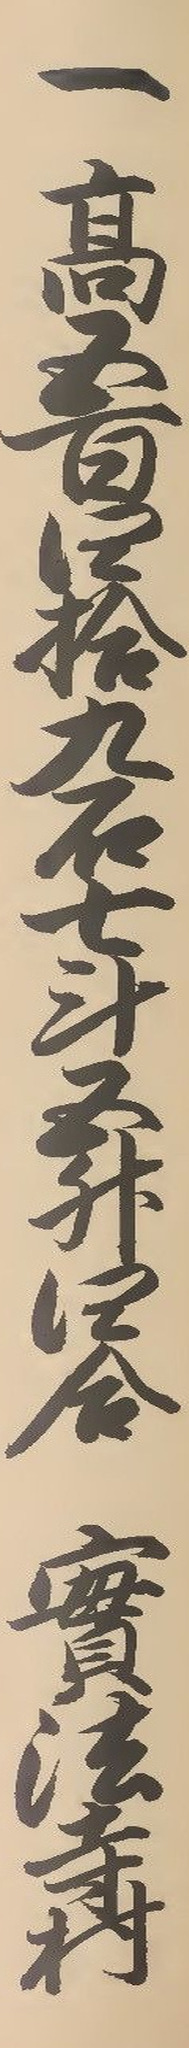一髙五百四拾九石七斗五升四合實法寺村
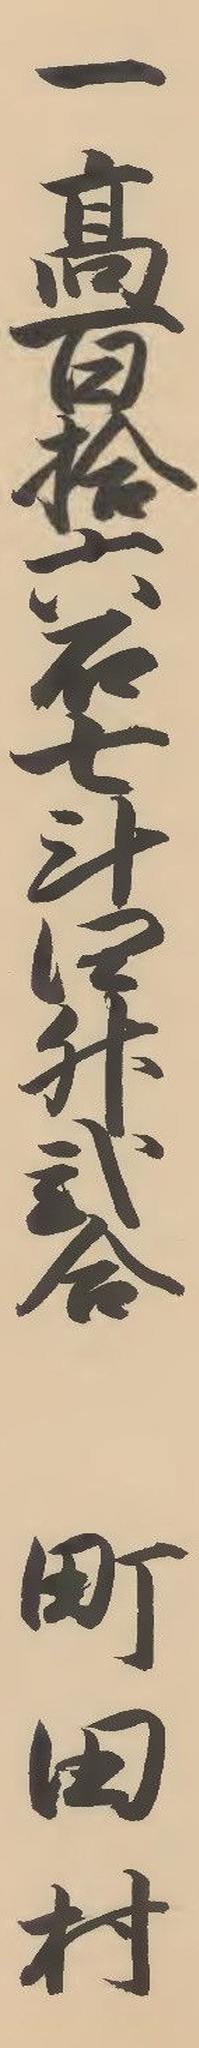一髙百拾六石七斗四升弐合町田村
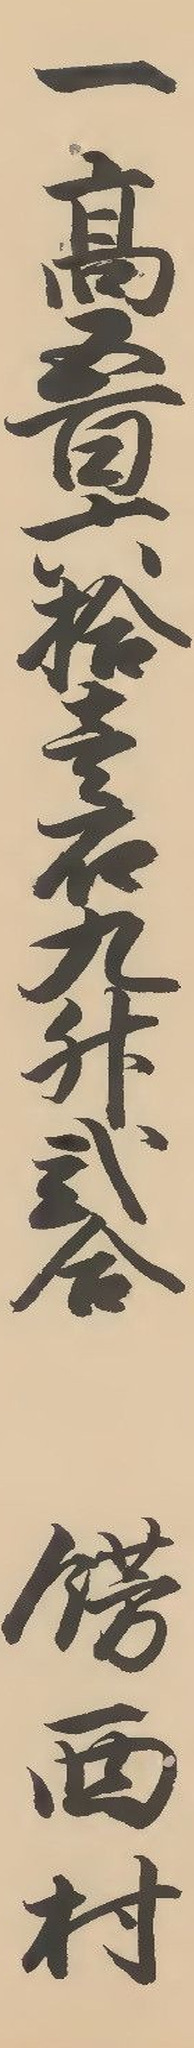一髙五百六拾壱石九升弐合餝西村
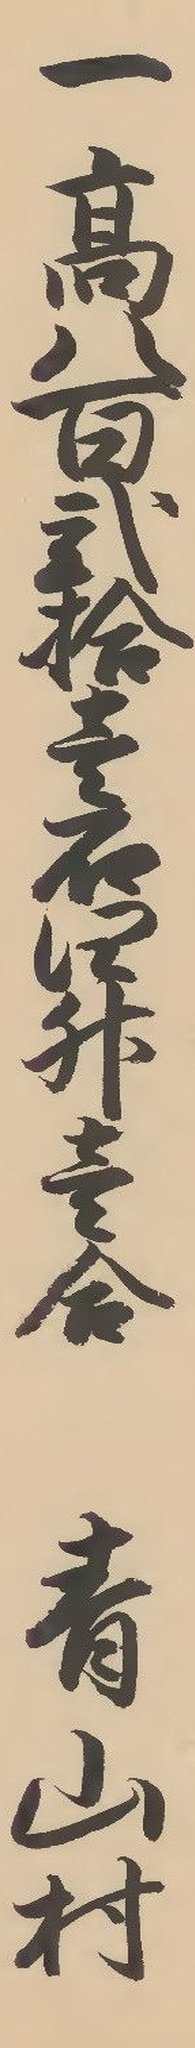一髙八百弐拾壱石四升壱合青山村

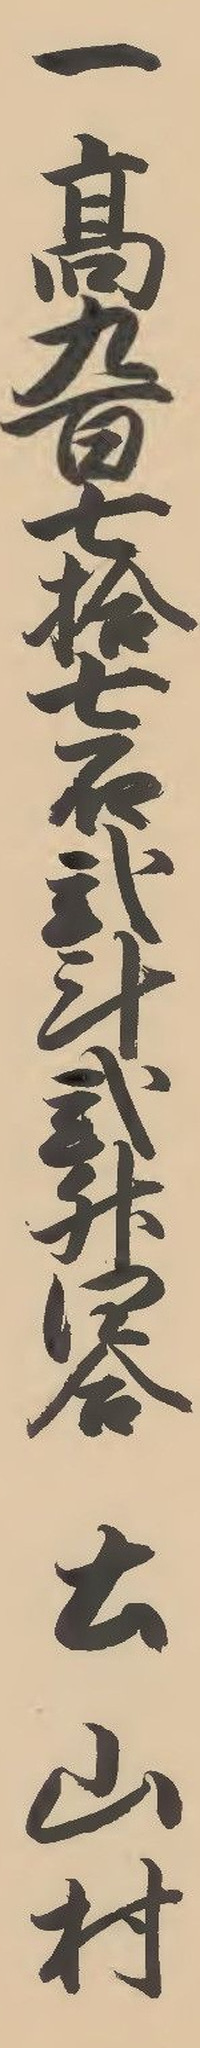一髙九百七拾七石弐斗弐升四合土山村
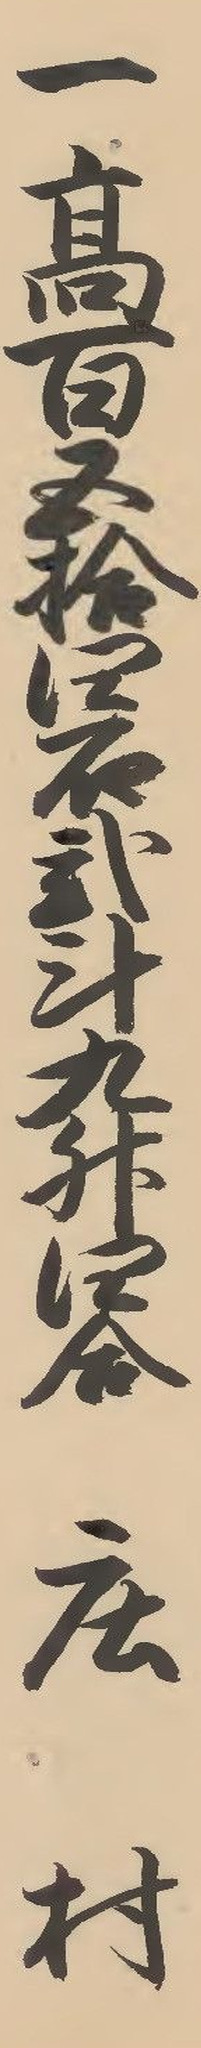一髙百五拾四石弐斗九升四合庄村
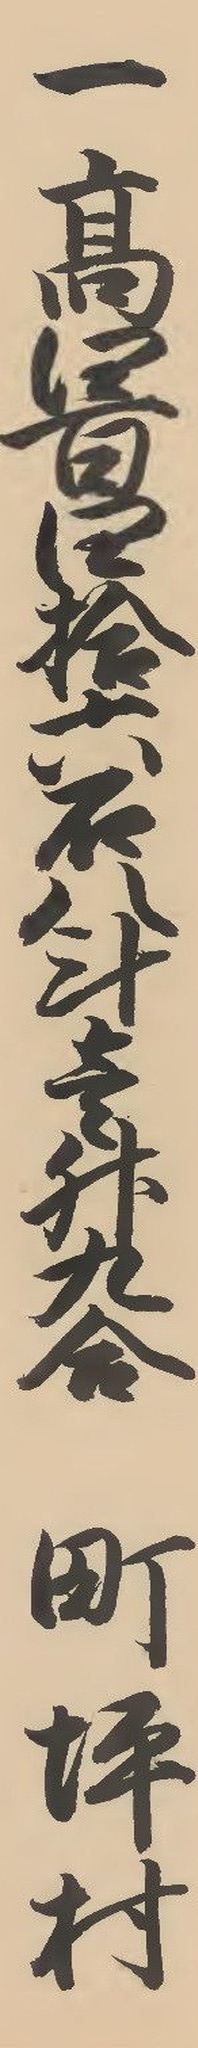一髙四百四拾六石八斗壱升九合町坪村
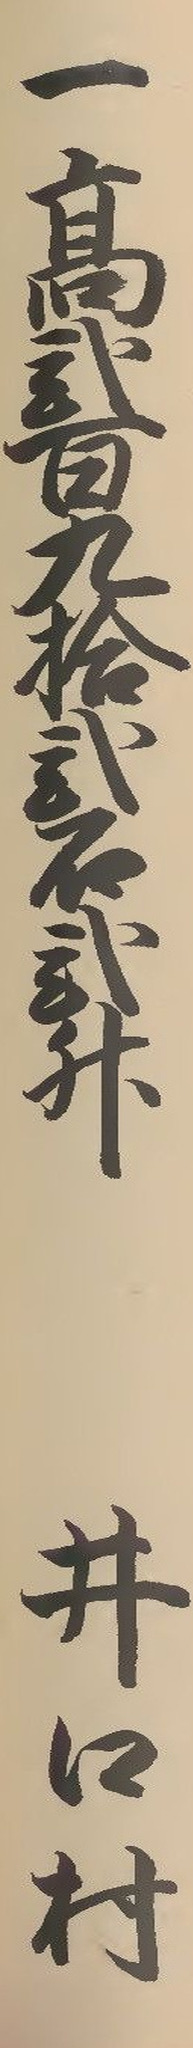一髙弐百九拾弐石弐升井口村
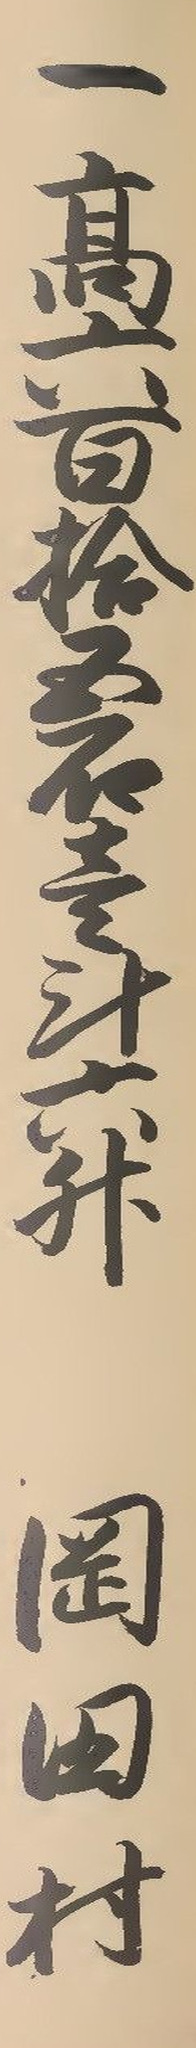一髙六百拾五石壱斗六升岡田村
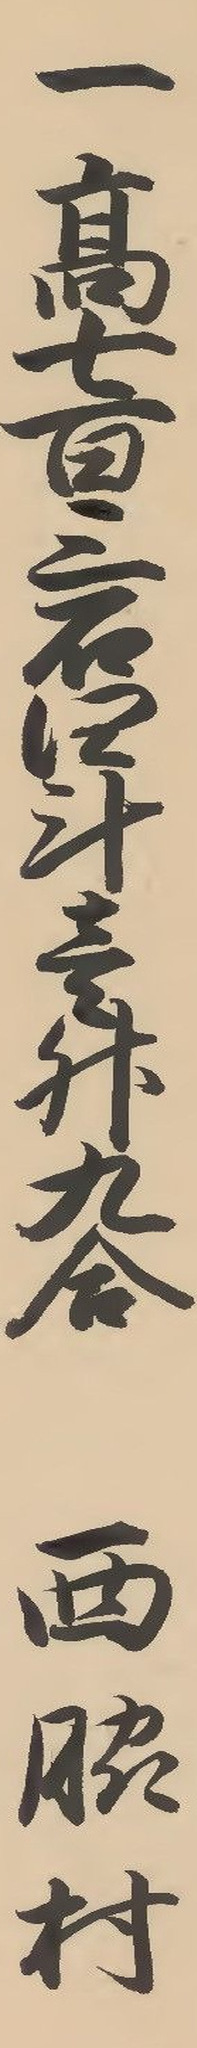一髙七百三石四斗壱升九合西脇村
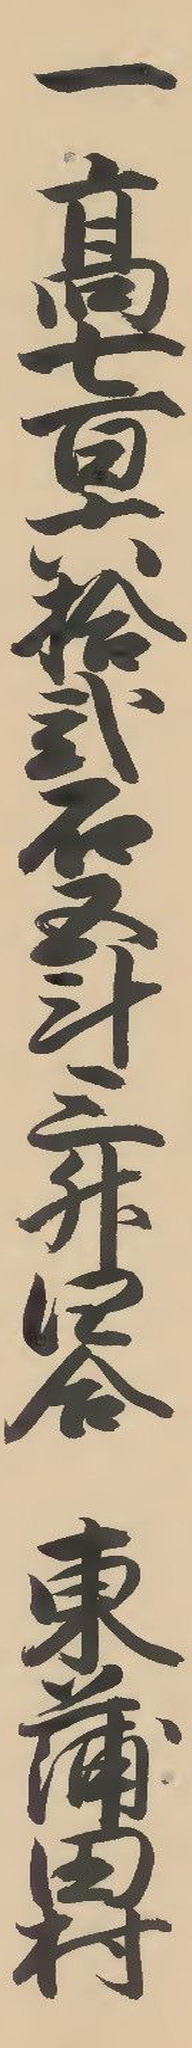一髙七百六拾弐石五斗三升四合東蒲田村
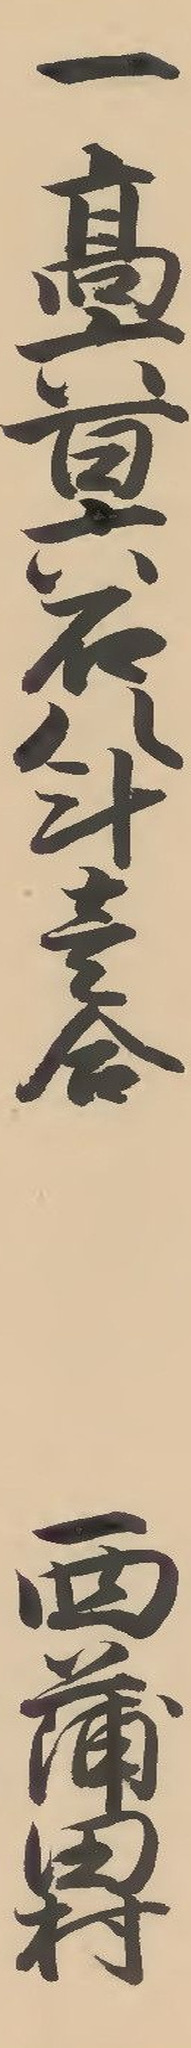一髙六百六石八斗壱合西蒲田村

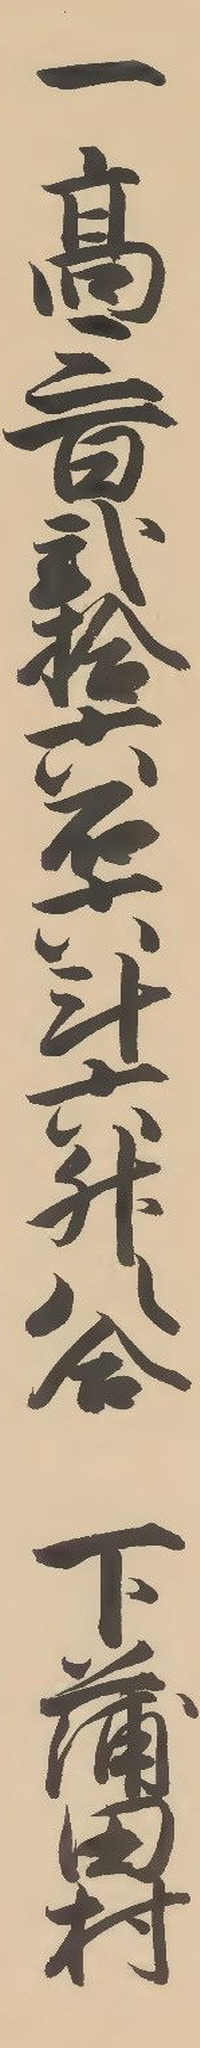一髙三百弐拾六石六斗六升八合下蒲田村
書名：播磨国郷帳
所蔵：国立公文書館 National Archives of Japan
